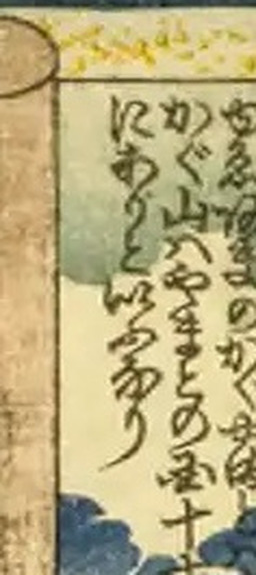にありといふなり
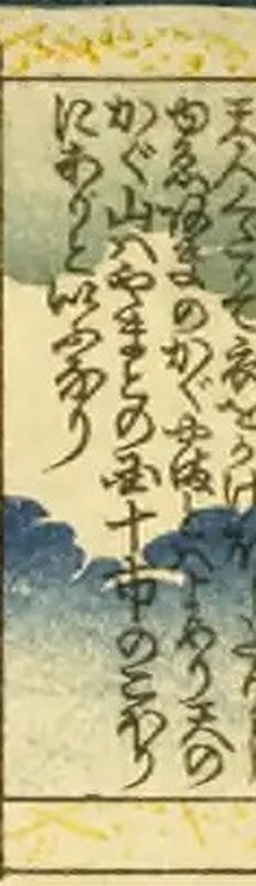かぐ山はやまとの国十市のこほり
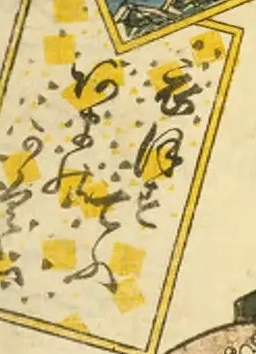あまの
